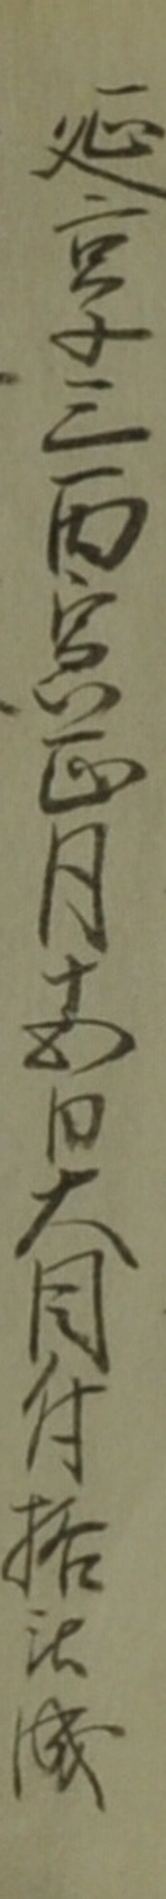一延享三丙寅正月十五日大目付格被成
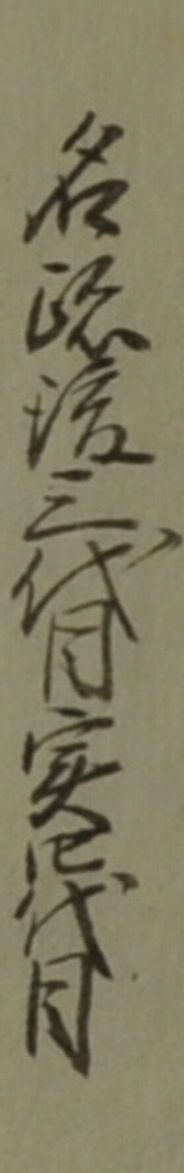名跡後三代目実四代目
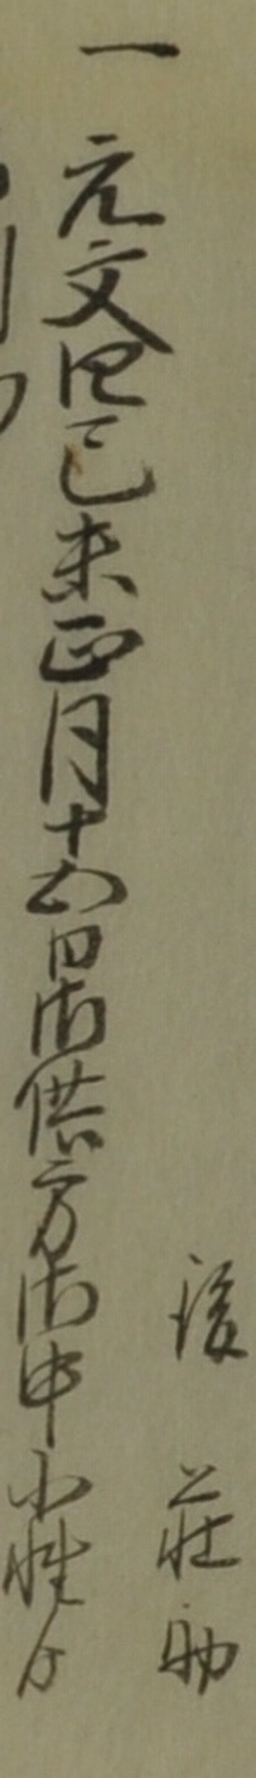一元文四己未正月十五日御供方御中小性ゟ
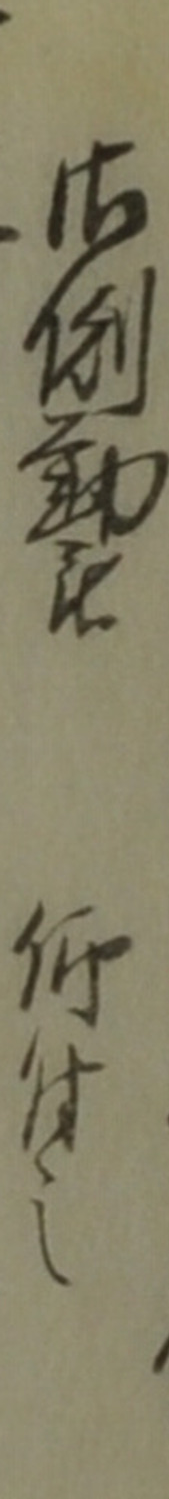御側勤被仰付之
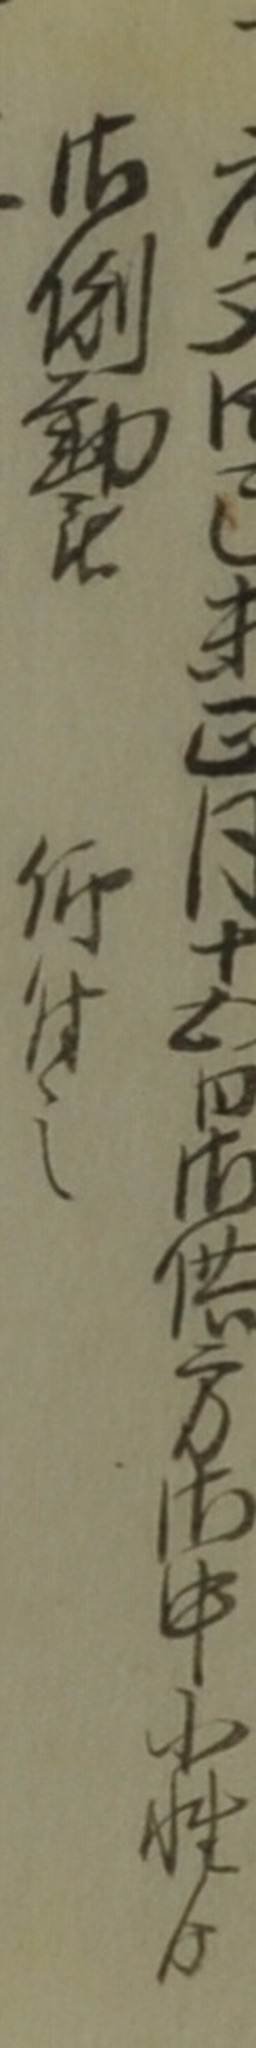御側勤被仰付之
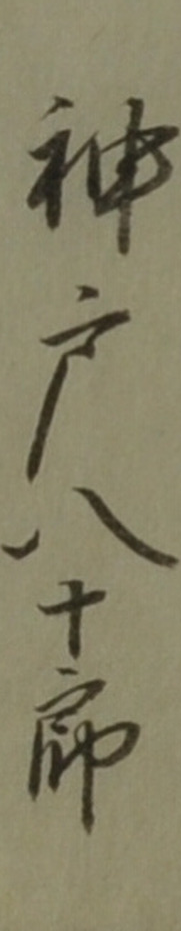神戸八十郎
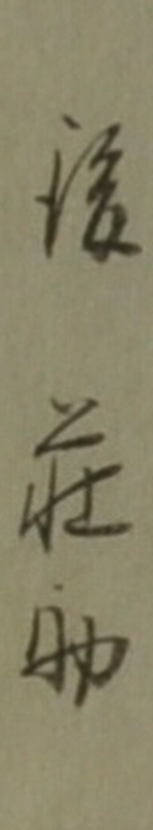後荘助
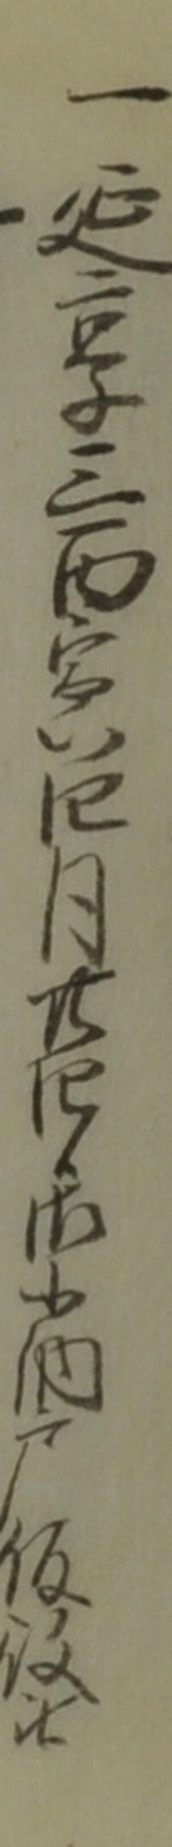一延享三丙寅四月廿四日御小納戸仮役被
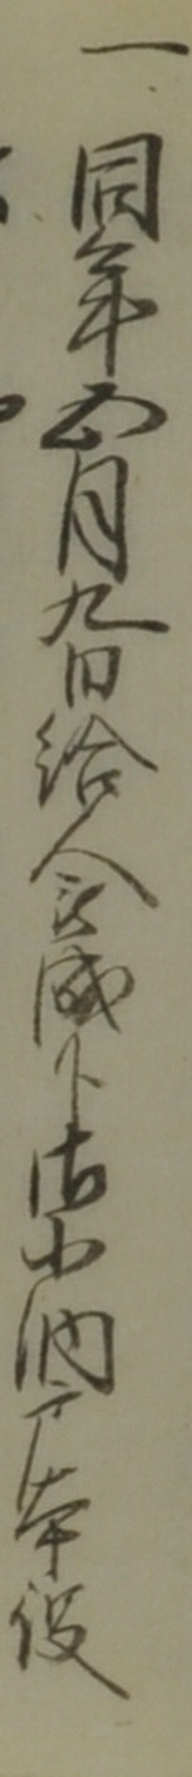一同年五月九日給人被成下御小納戸本役
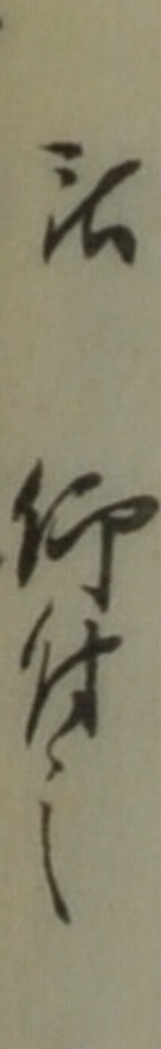被仰付之
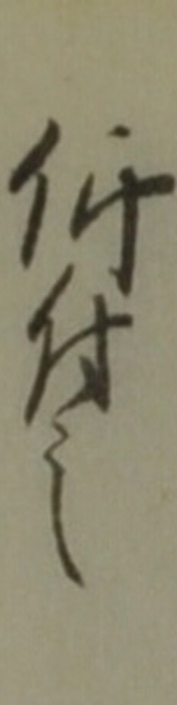仰付之
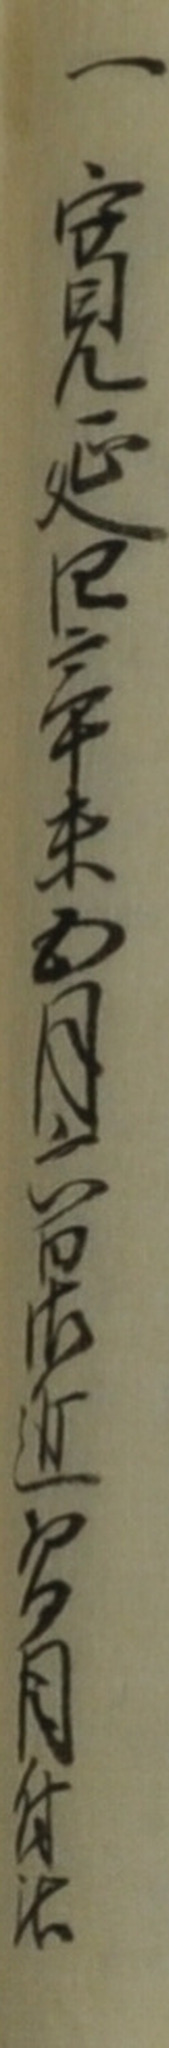一寛延四辛未五月六日御近習目付被
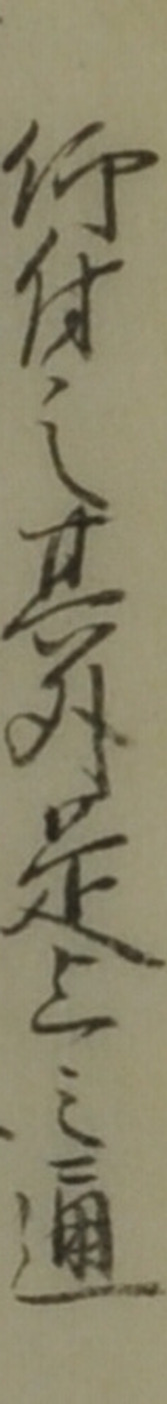仰付之其外是迄之通
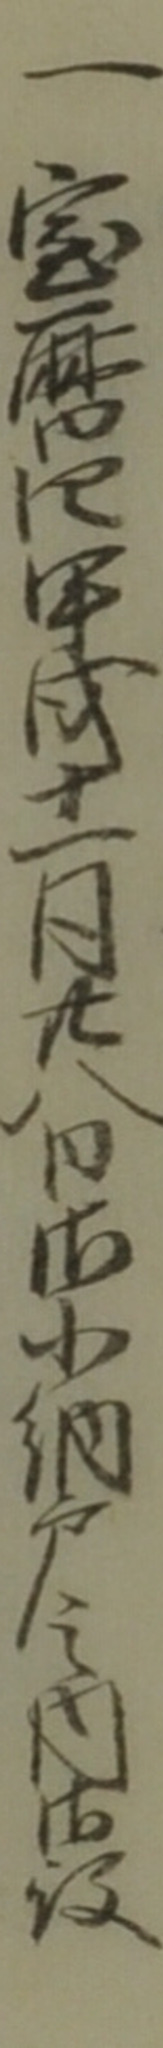一宝暦四甲戌十一月廿八日御小納戸之内御役
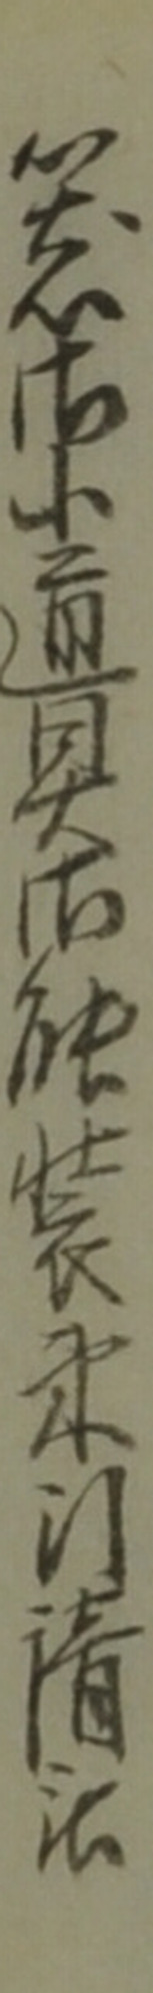器御小道具御能装束引請被
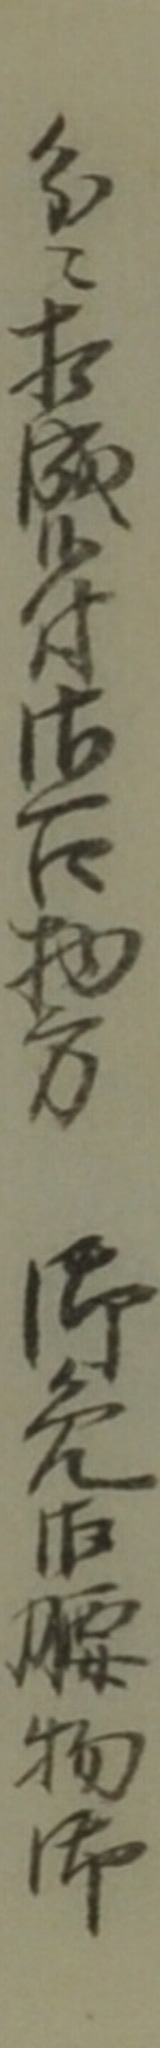分ニ相成候付御召物方御免御腰物御
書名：諸御役代々録（五）
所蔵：伊那市立高遠町図書館・合同会社AMANE
